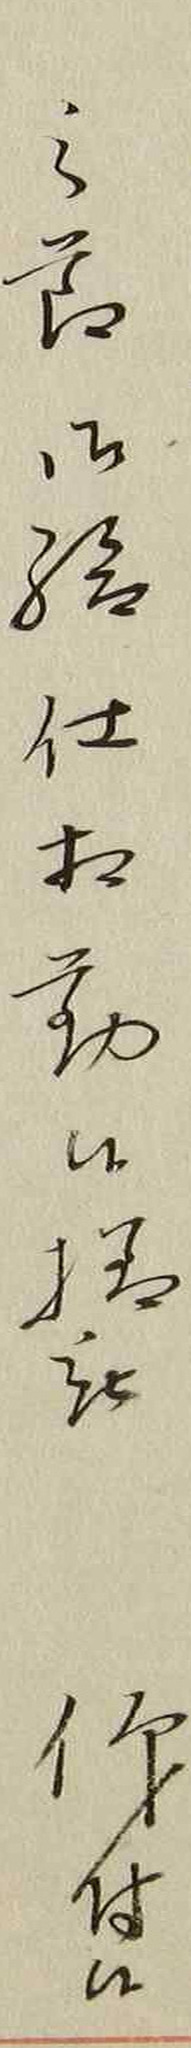之節御給仕相勤候様被仰付候
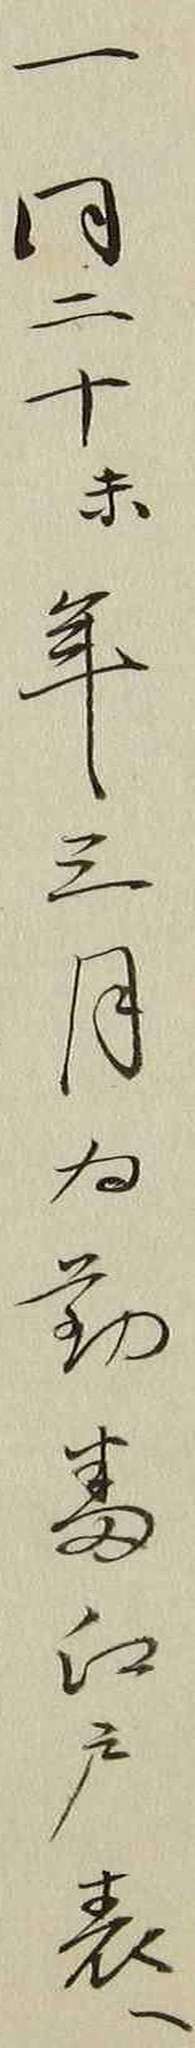一同二十未年三月為勤番江戸表へ
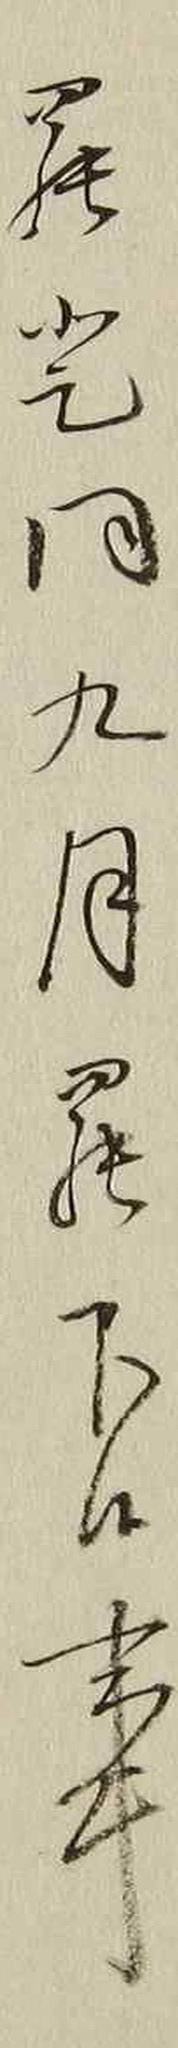罷登同九月罷下候事
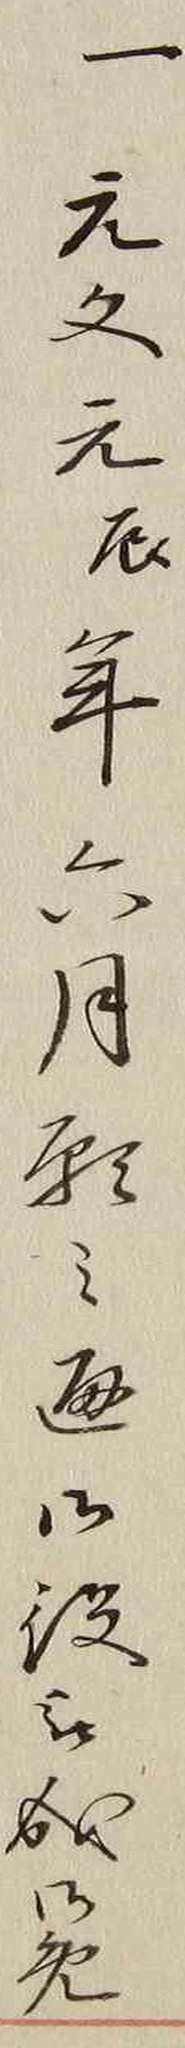一元文元辰年六月願之通御役被成御免
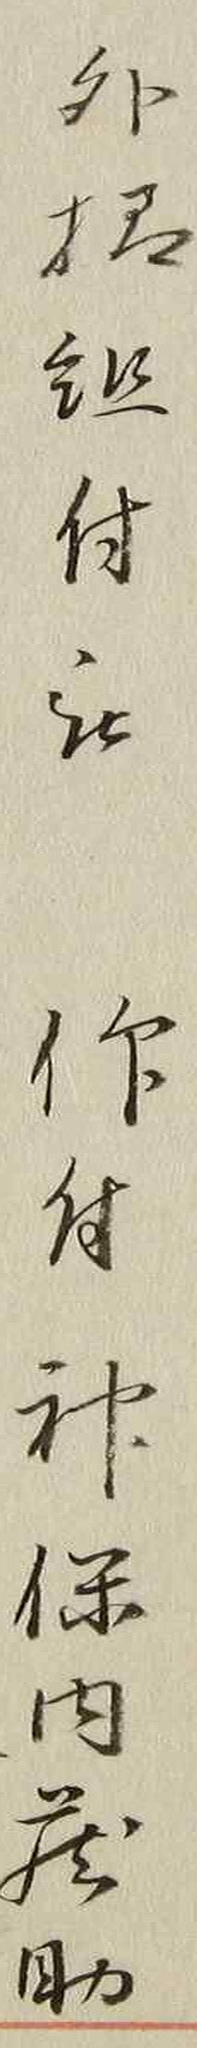外様組付被仰付神保内蔵助
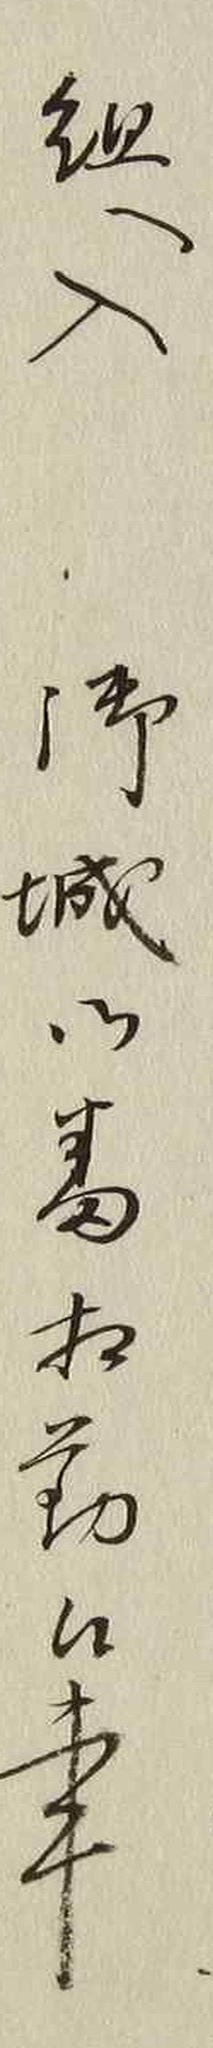組へ入御城御番相勤候事
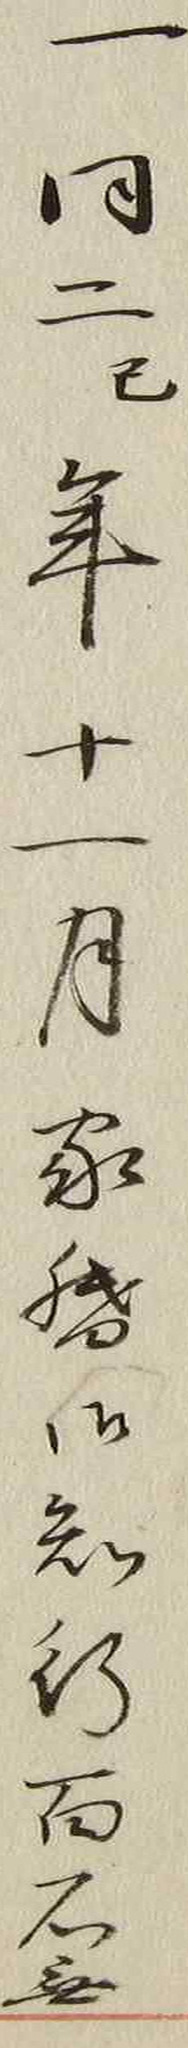一同二巳年十一月家督御知行百石無
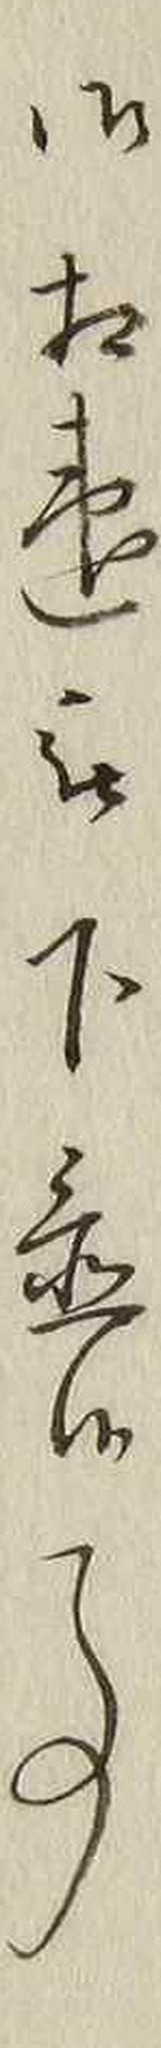御相違被下置候事
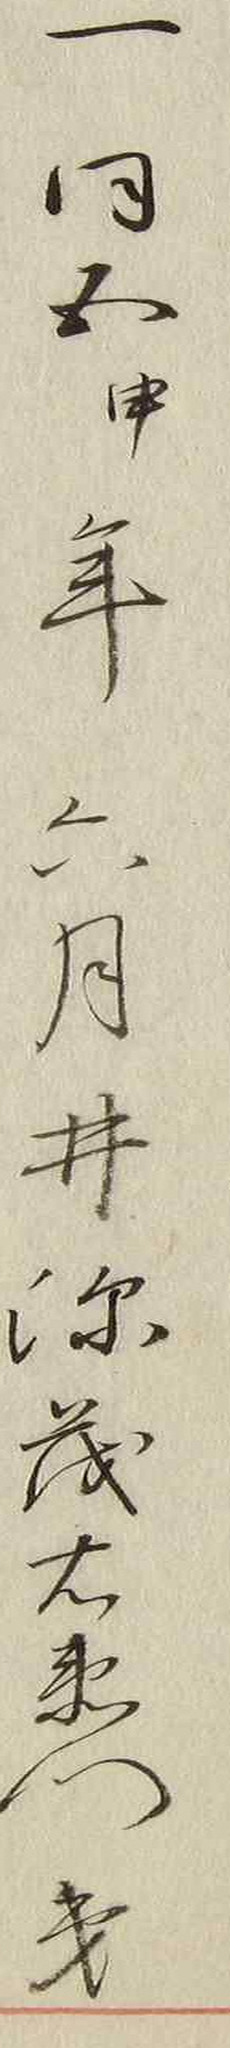一同五申年六月井深茂右衛門弟
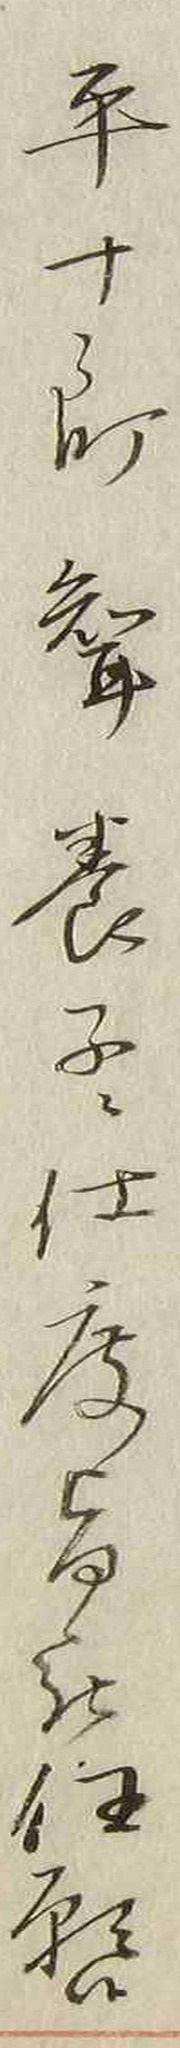平十郎聟養子ニ仕度旨被任願候
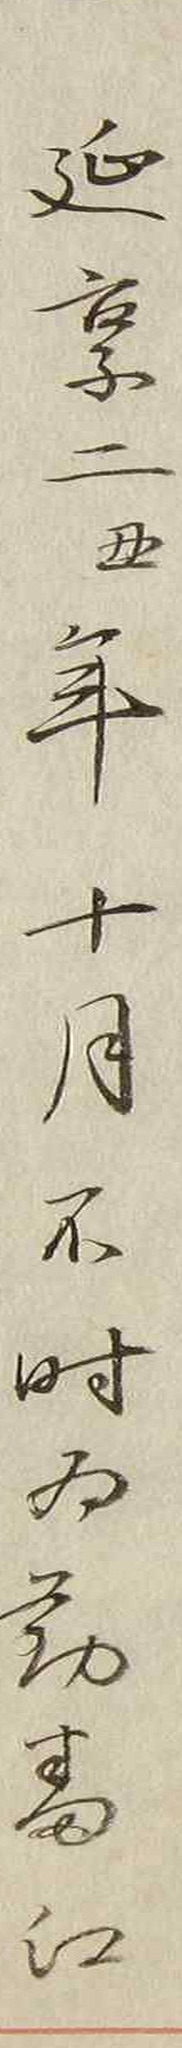一延享二丑年十月不時為勤番江
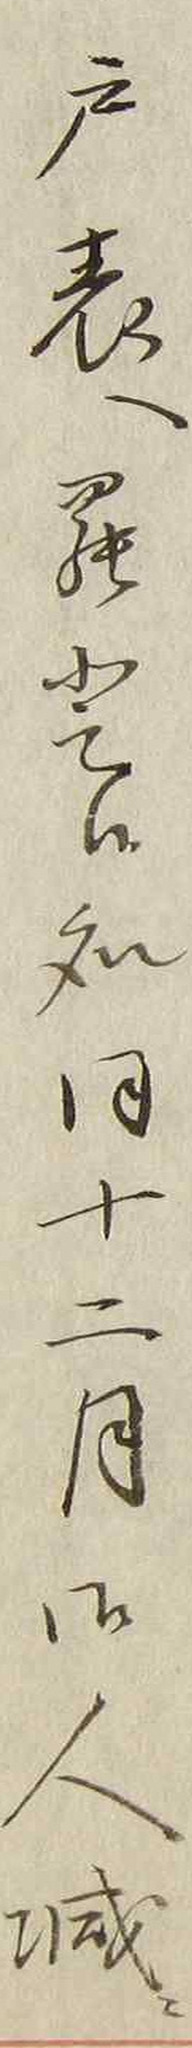戸表へ罷登候処同十二月御人減ニ

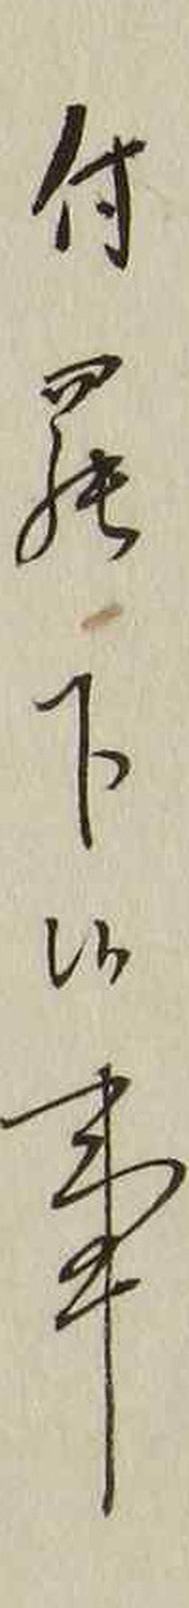付罷下候事
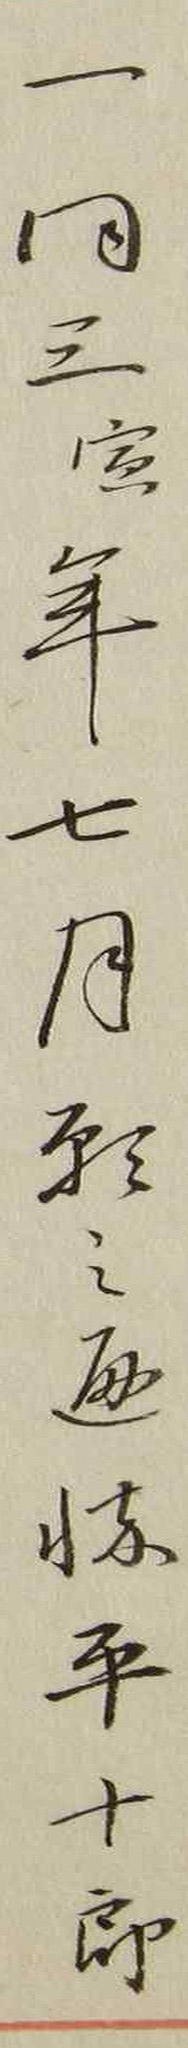一同三寅年七月願之通悴平十郎
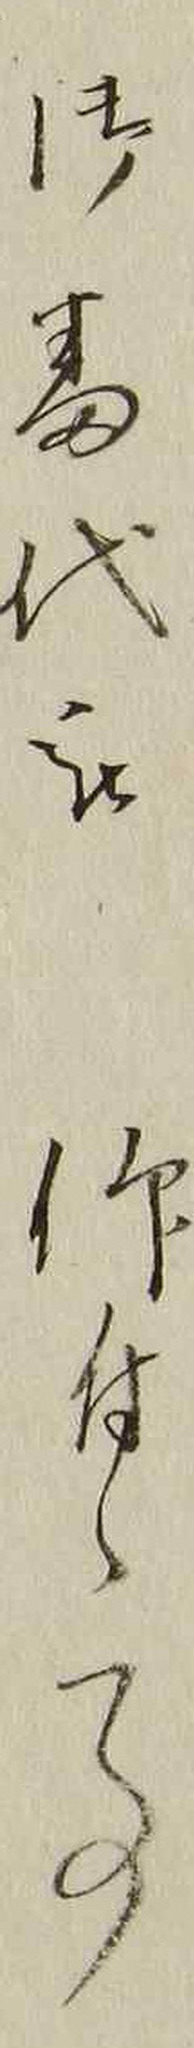御番代被仰付候事
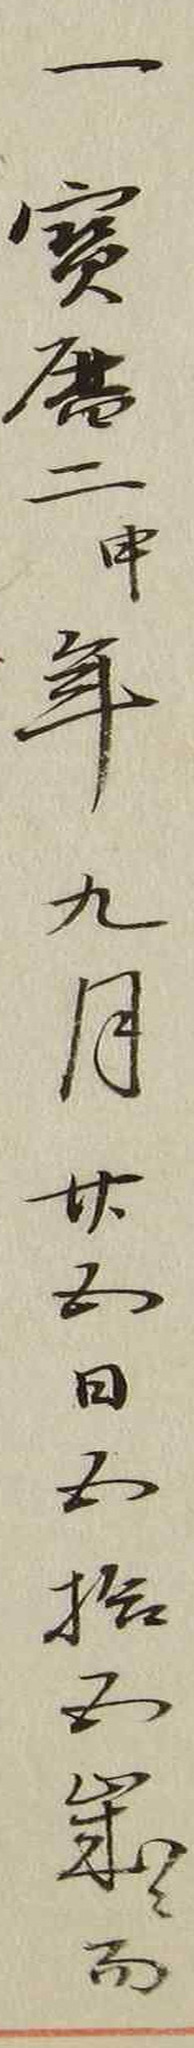一宝暦二申年九月廿五日五拾五歳ニ而
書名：諸士系譜　巻之22　い之部22
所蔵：会津若松市立会津図書館
